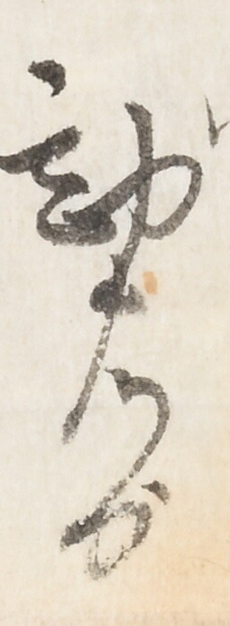金右衛門
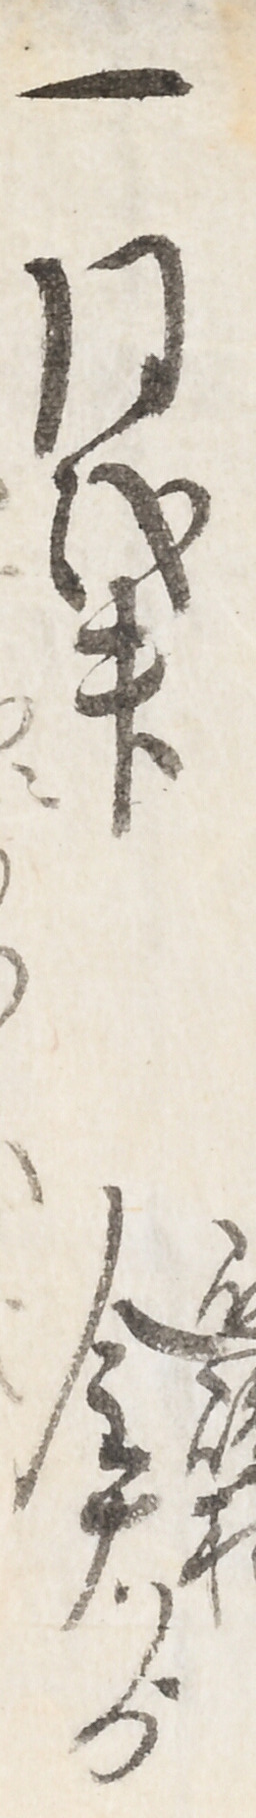一同弐升金右衛門
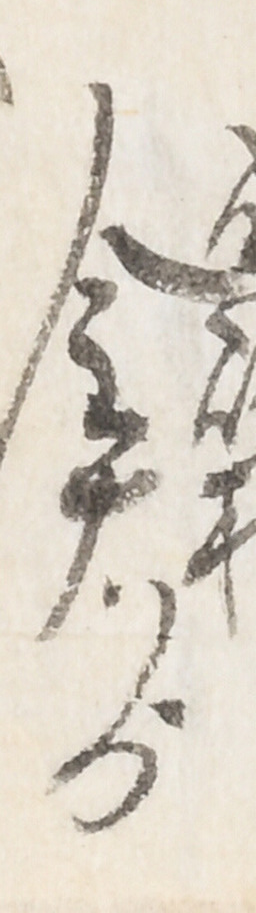金右衛門
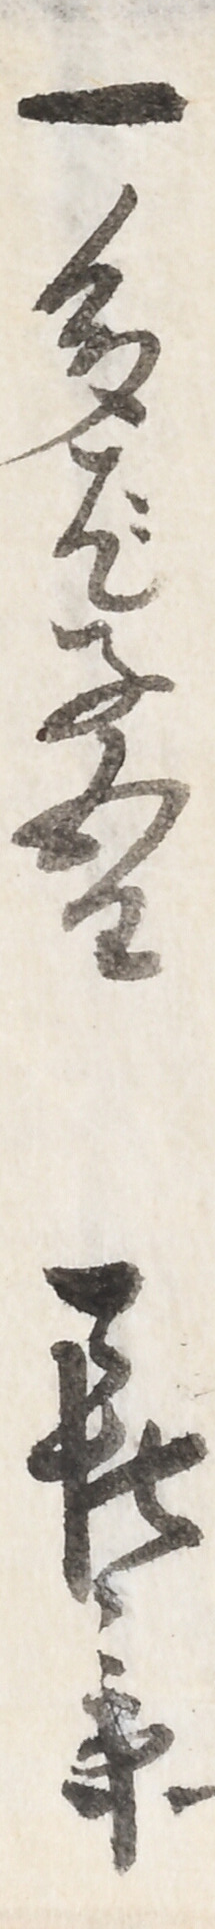一たばこ五わ喜兵衛
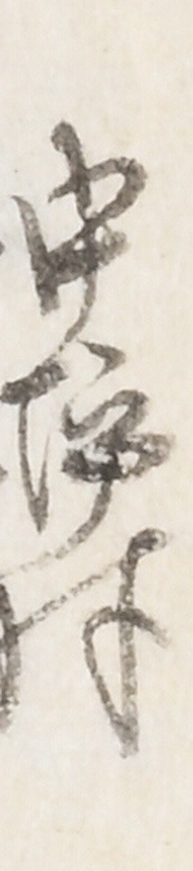中越村
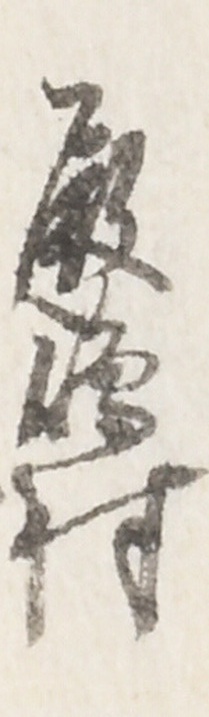殿嶋村
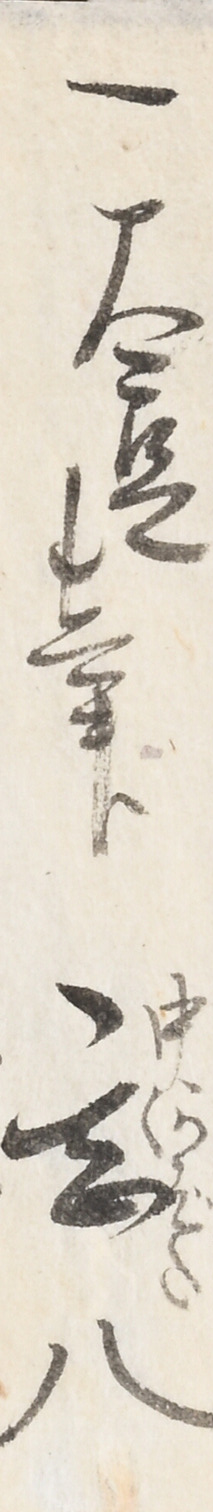一太豆壱升甚八
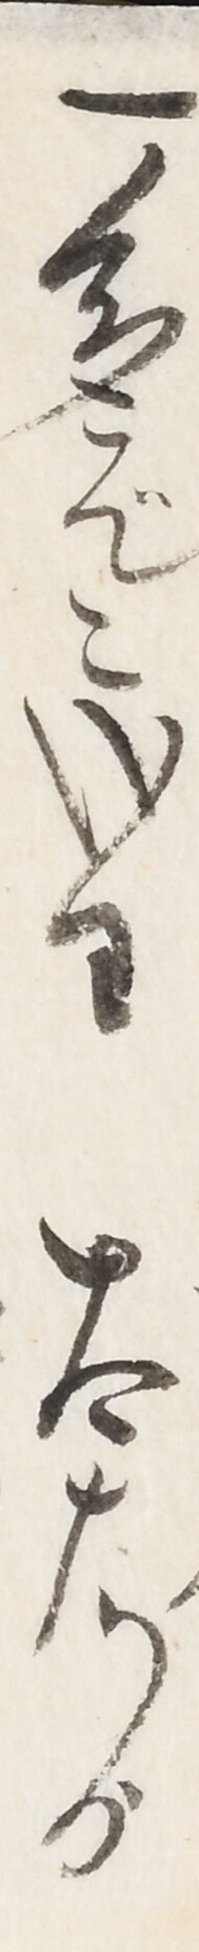一たばこ弐わ太右衛門
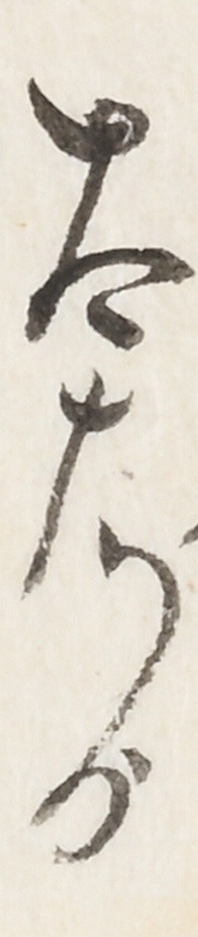金右衛門
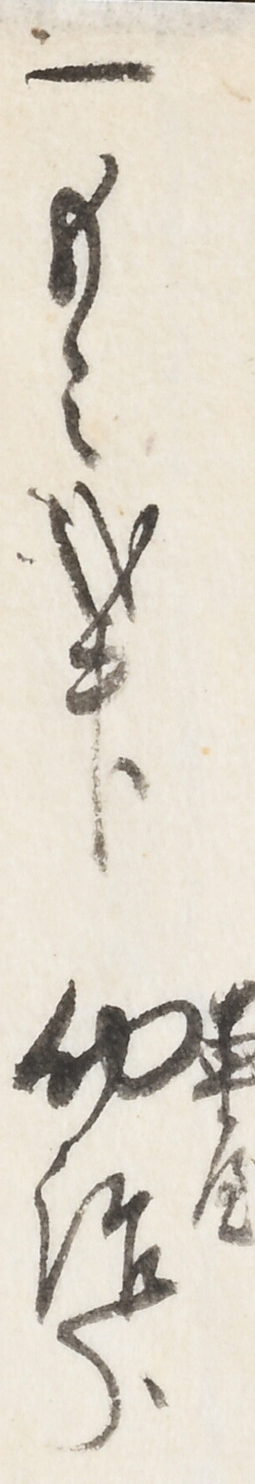一もみ弐升助治郎
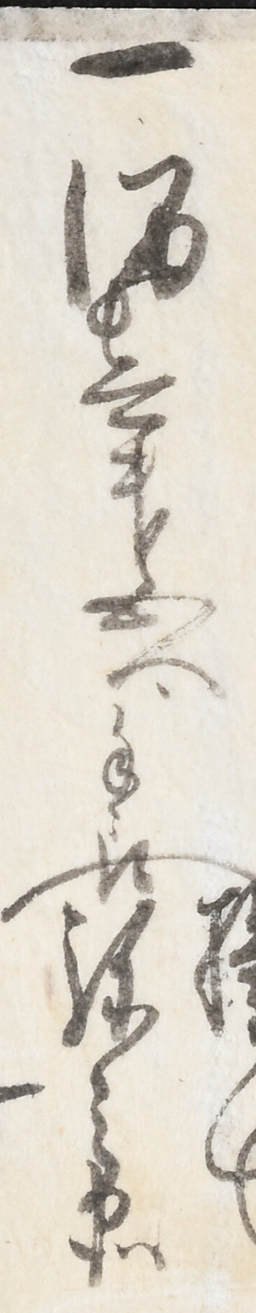一酒壱升五合手良弥兵衛
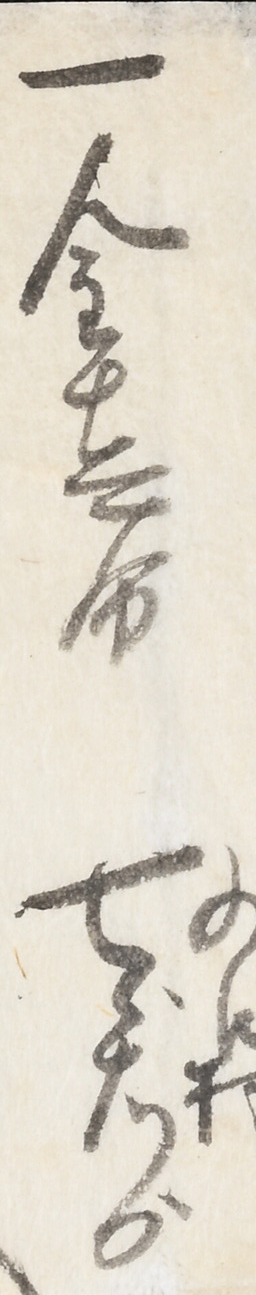一金壱分七郎右衛門

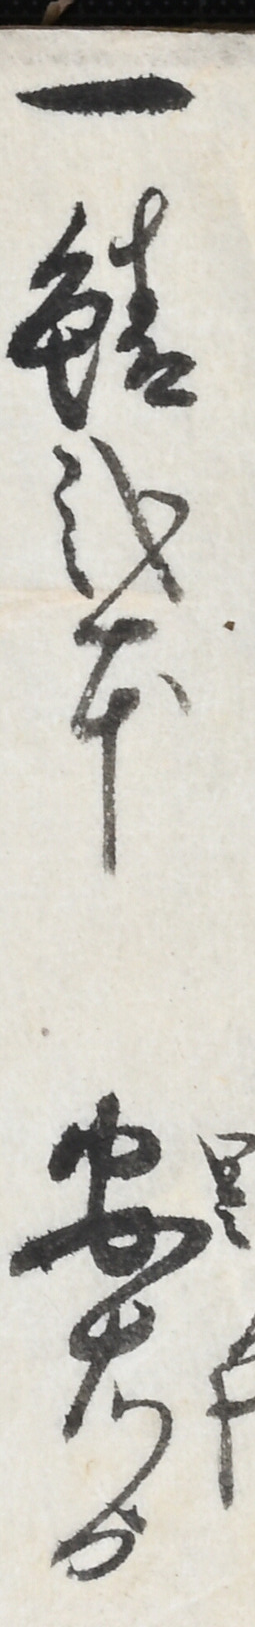一鯖弐本安右衛門
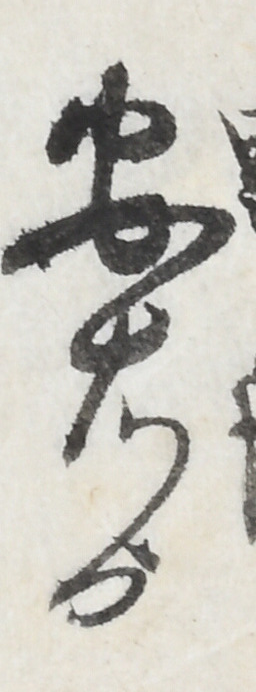十右衛門
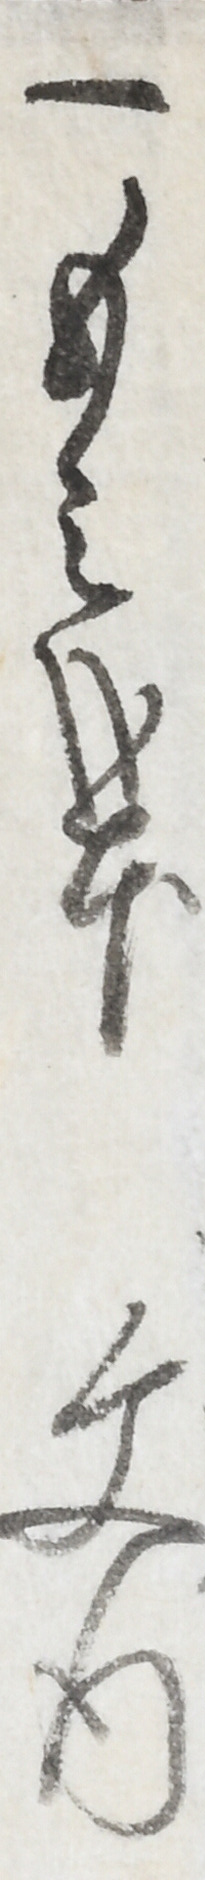一もみ弐本文内
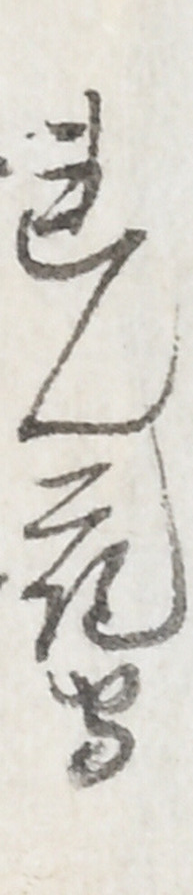れん花寺
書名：合力覚帳
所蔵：伊那市立高遠町図書館・合同会社AMANE
